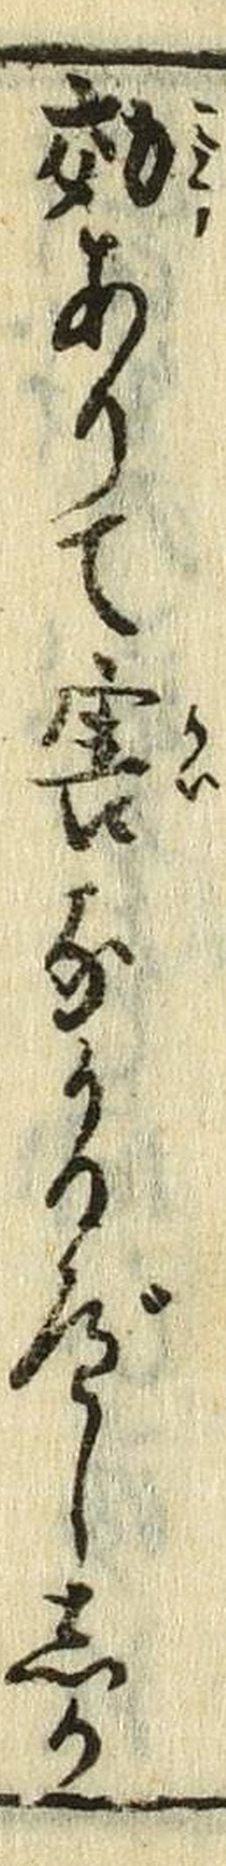効ありて害なかるべししか
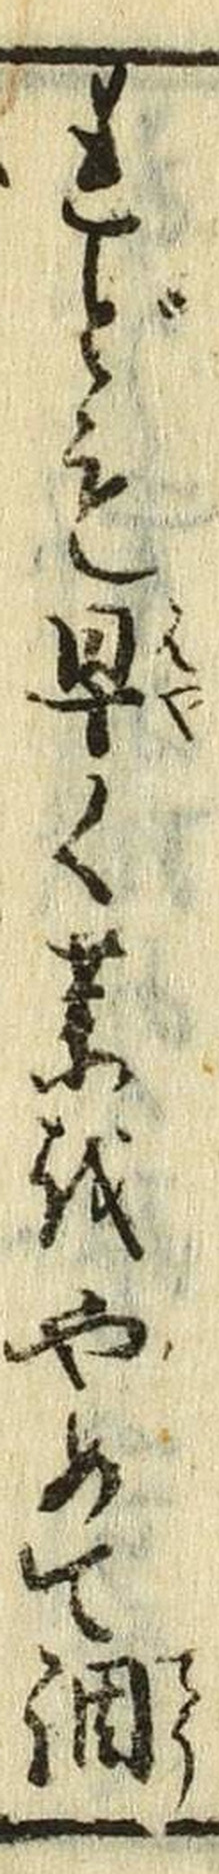れども早く薬をやめて調
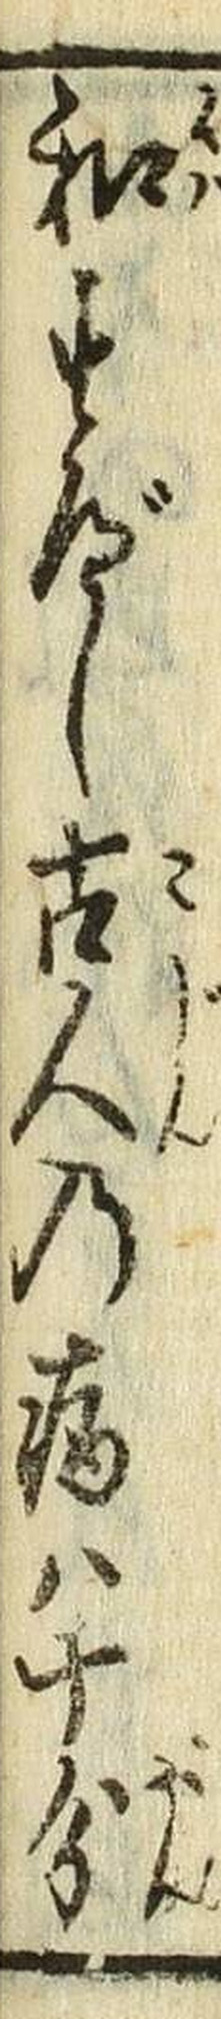和すべし古人の病は十分
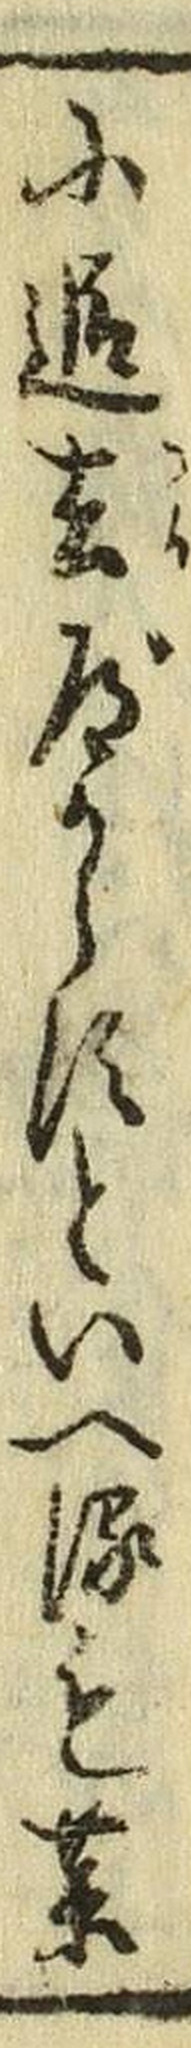に追去べからずといへるも薬
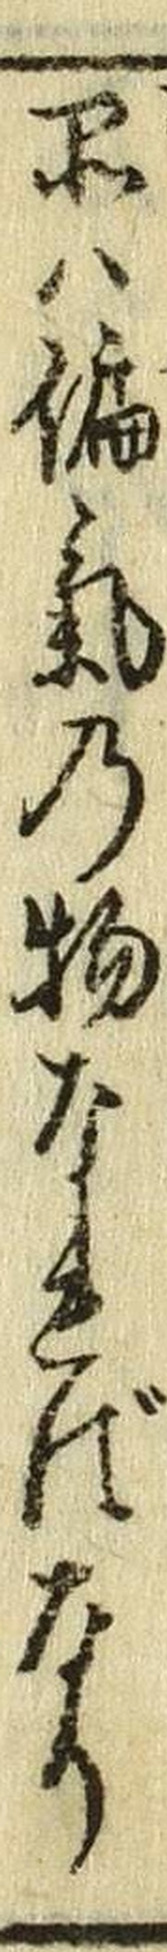品は偏気の物なればなり
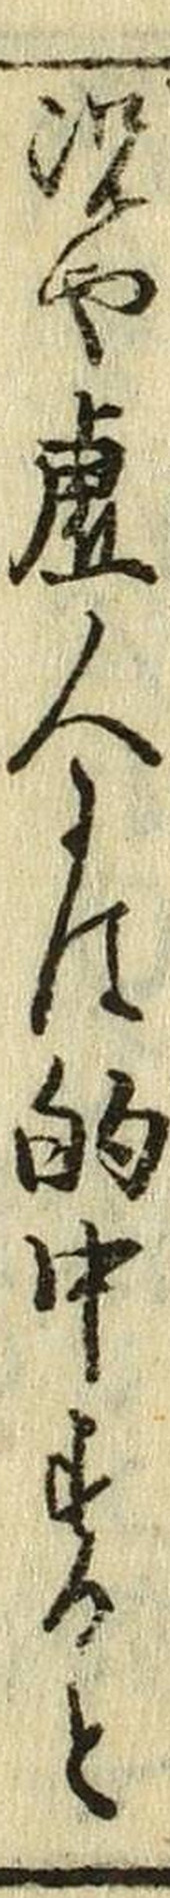況や虚人には的中すると
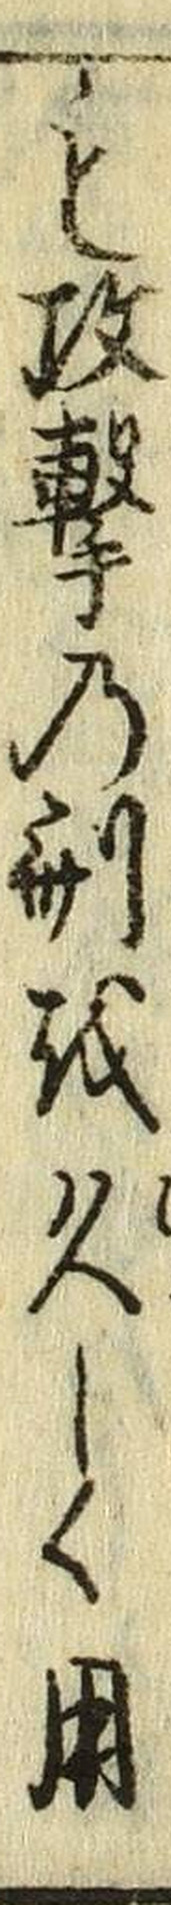も攻撃の剤を久しく用
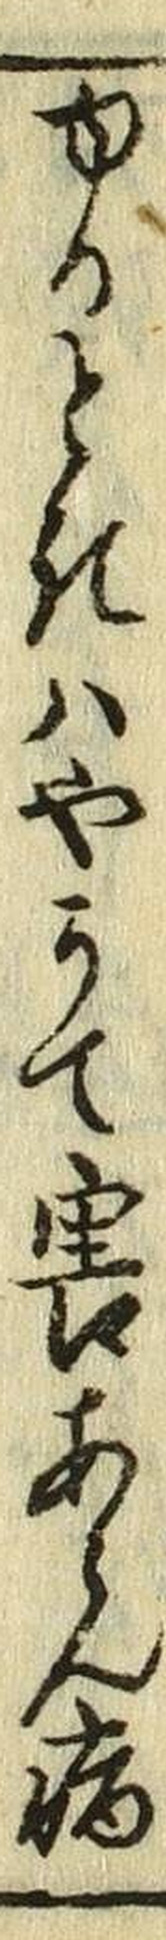ゆるときはやかて害あらん病
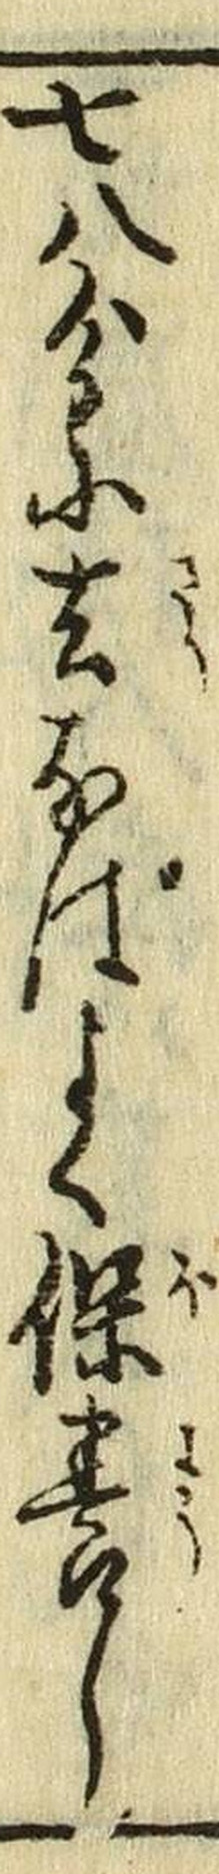七八分に去なばよく保養し
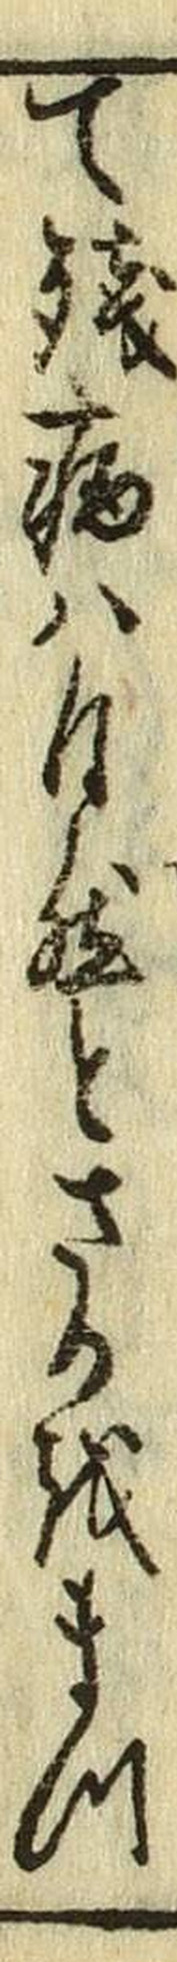て残病は自然とさるをまつ
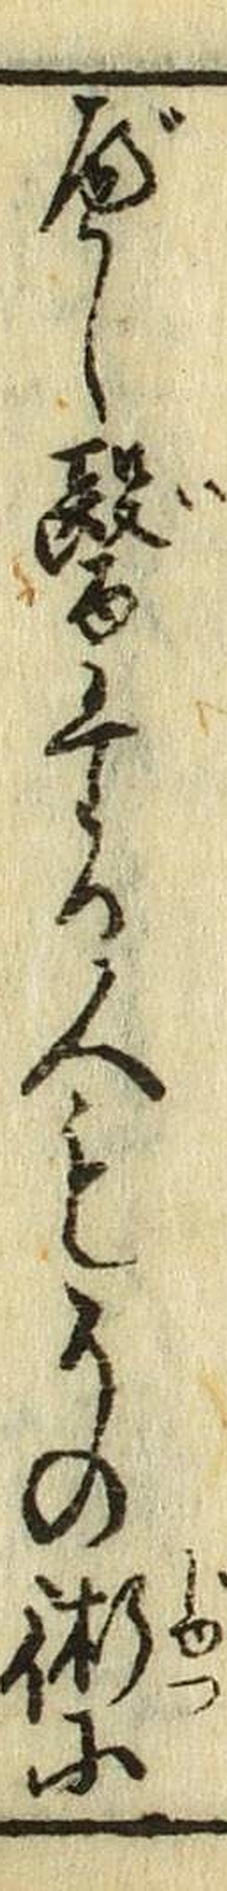べし医たる人もその術に
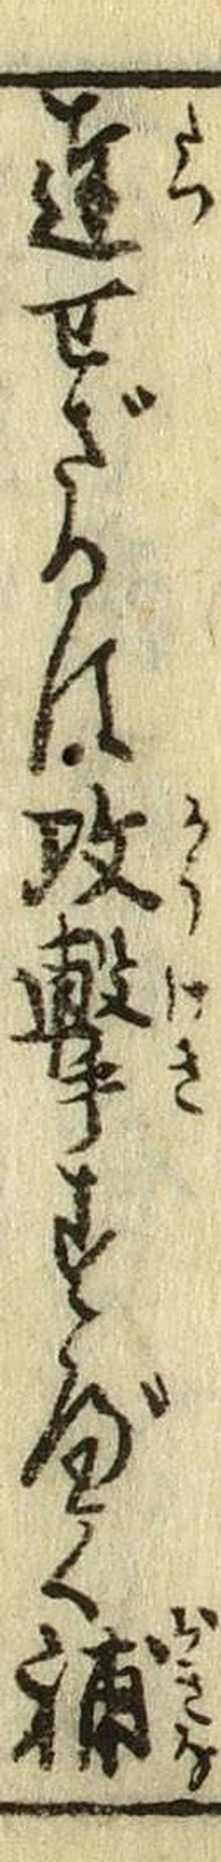達せざるは攻撃すべく補
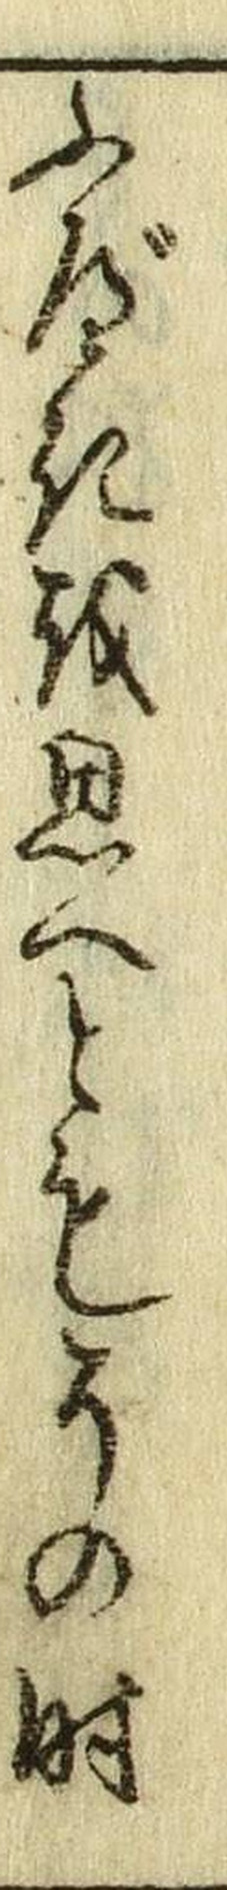ふべきを思へともその時
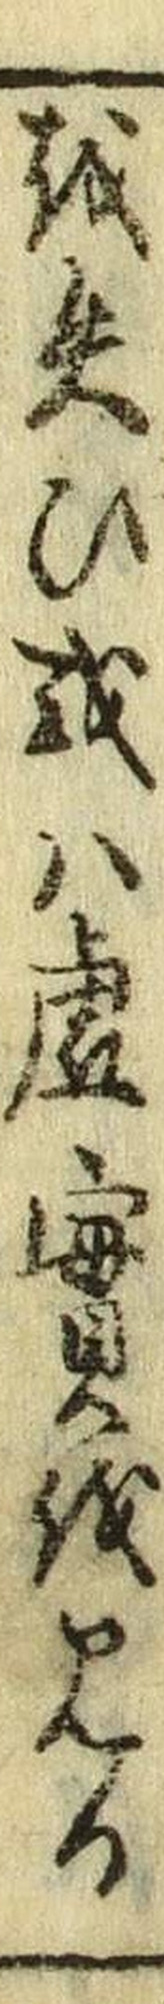を失ひ或は虚実を見る

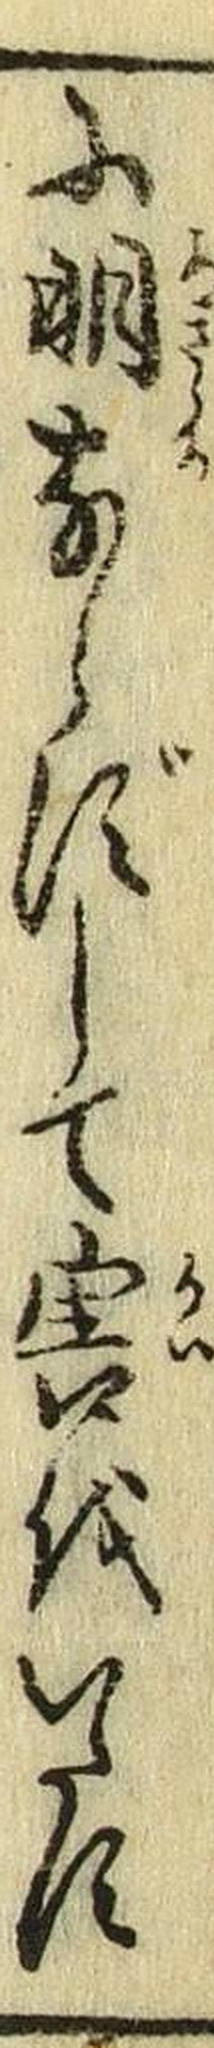に明ならずして害をいたす
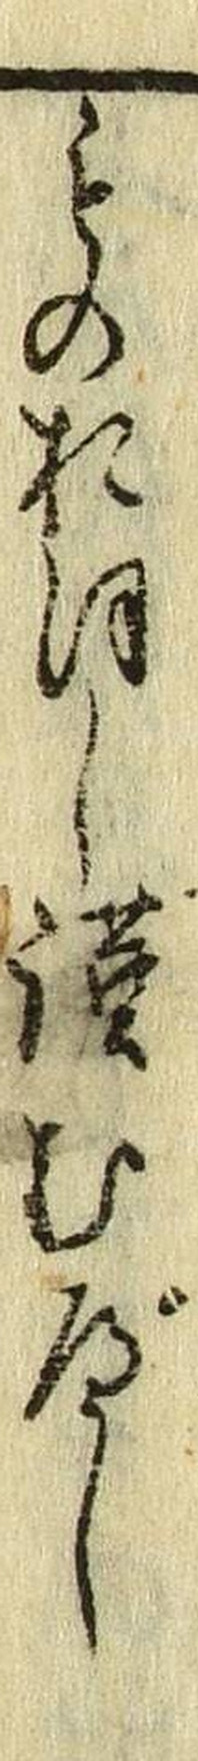ものおほし謹むべし
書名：居家養生記
